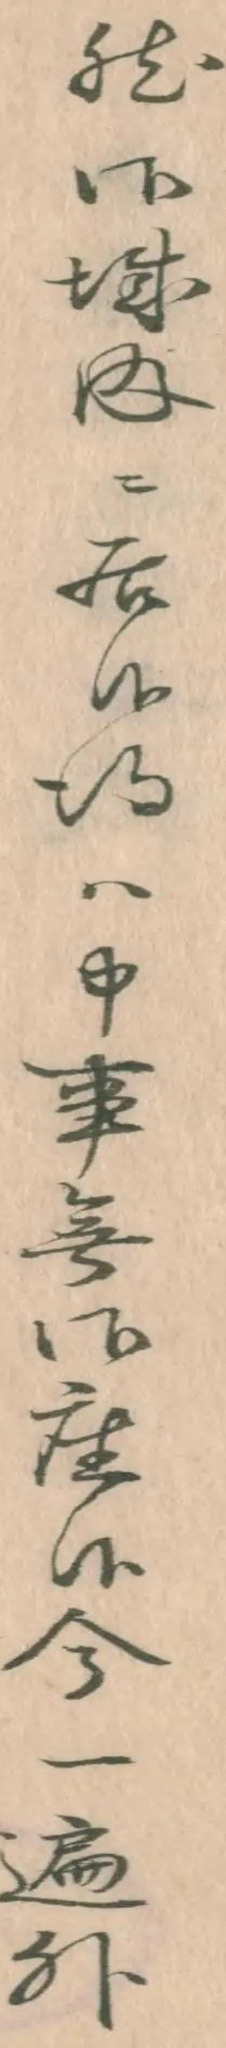然御城内に居候得は申事無御座候今一遍外
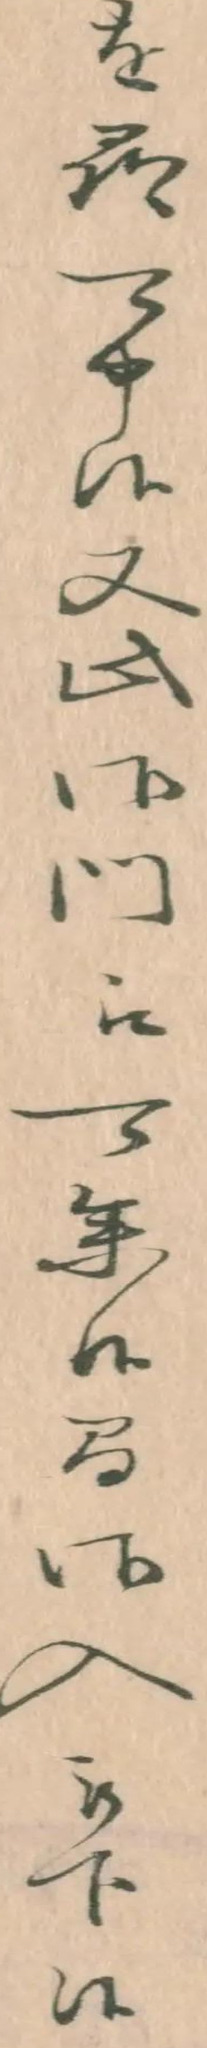を尋可申候又此御門江可参候間御入被下候
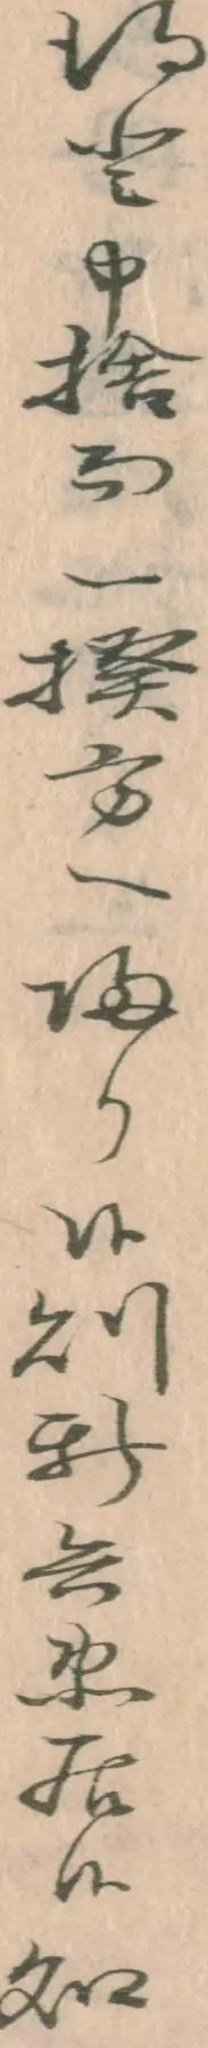得登申捨而一揆方へ帰り候則新兵衛居候処
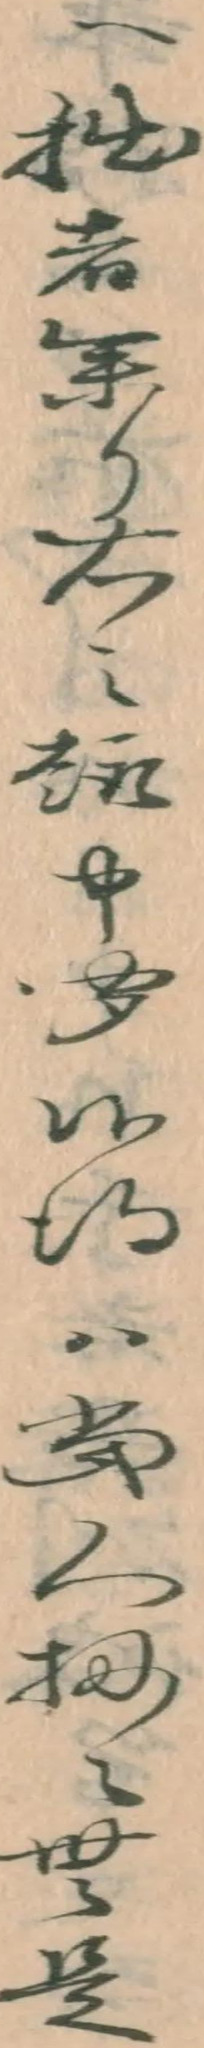へ拙者参り右之趣申聞候得は当人扨々無是
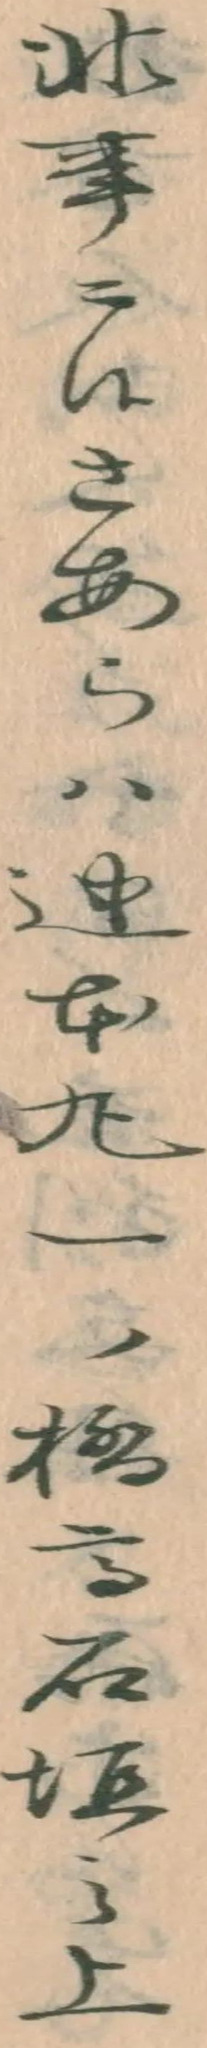此事に候さあらは迚本丸一之橋高石垣之上
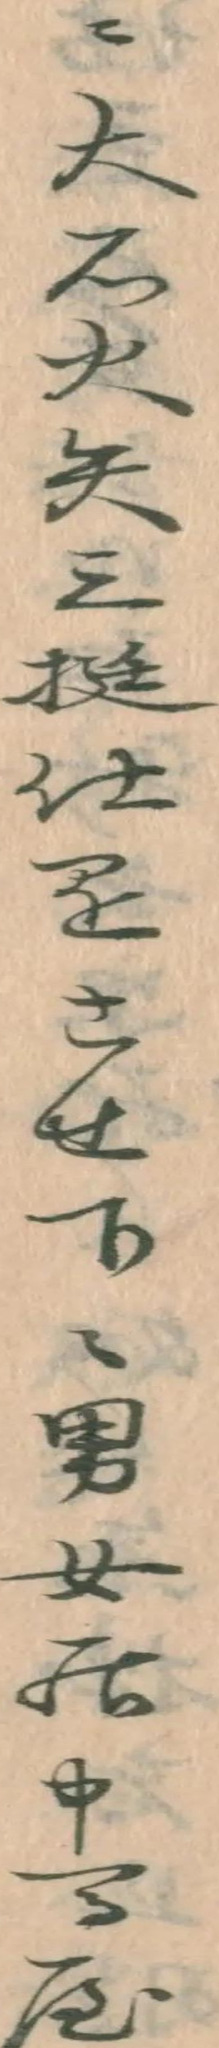に大石火矢三挺仕懸させ下に男女居申馬屋
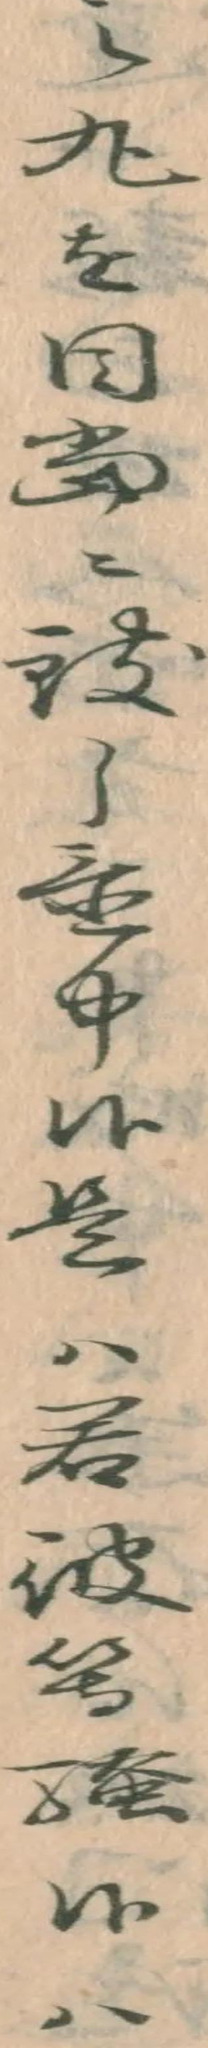之丸を目当に致し置申候是は若彼等騒候は
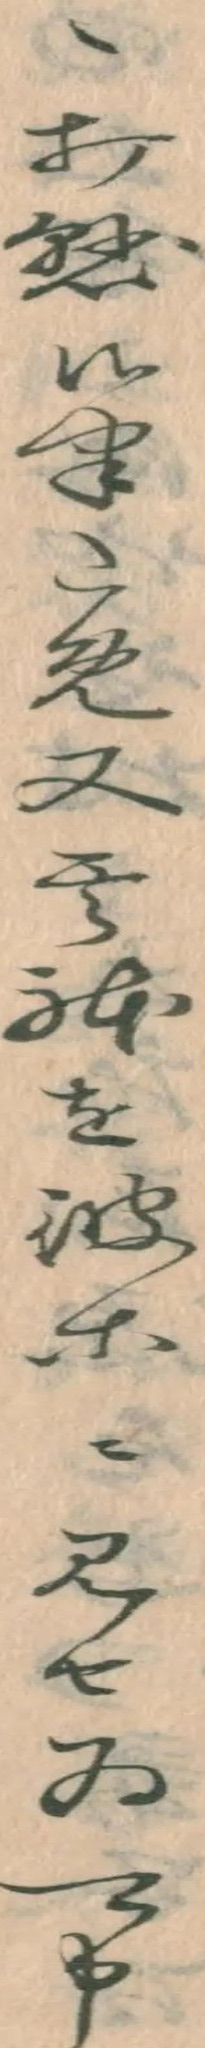ゝ打懸候半た免又其躰を彼等に見せゐ可申
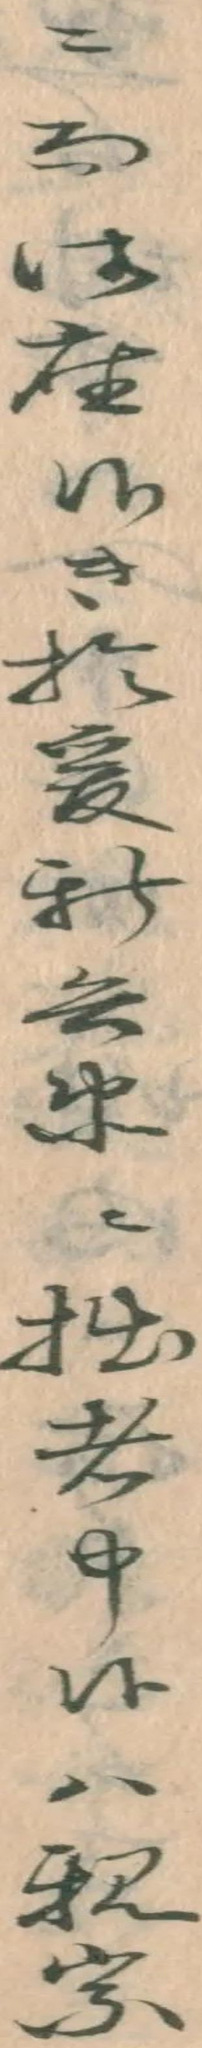に而御座候き於爰新兵衛に拙者申候は親宗
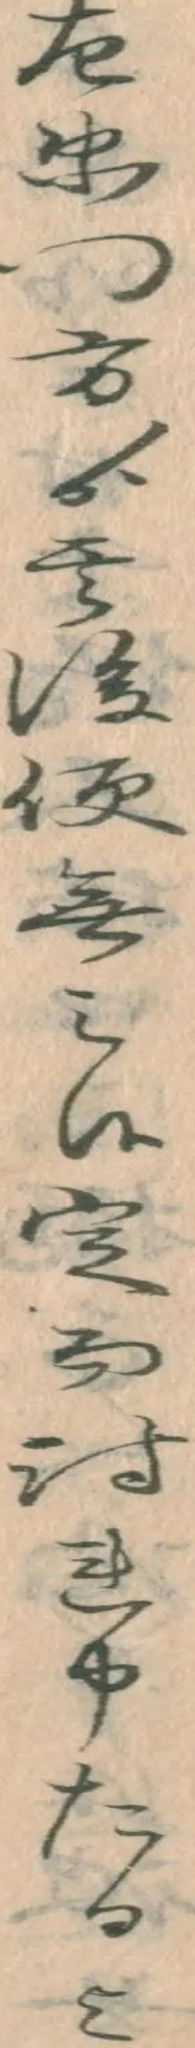左衛門方ゟ其後便無之候定而討連申たる与
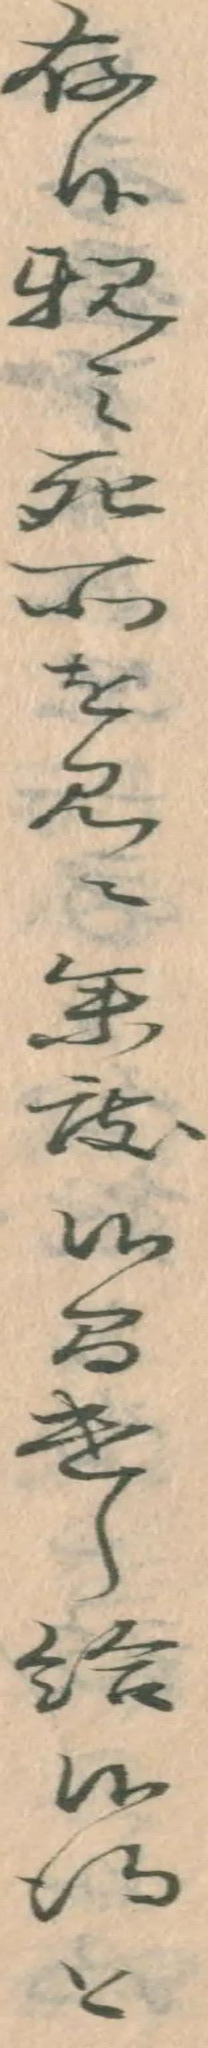存候親之死所を見に参度候間遣し給候得と
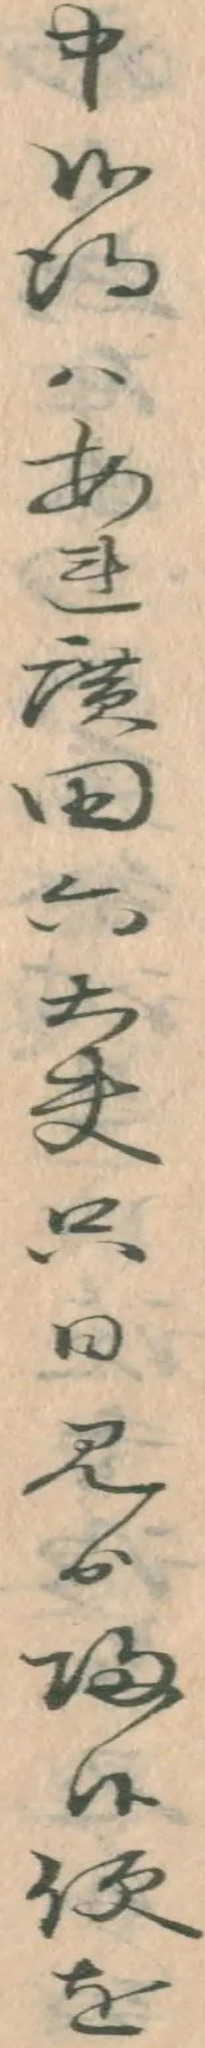申候得はあ連廣田六太夫只日見ゟ帰候便を
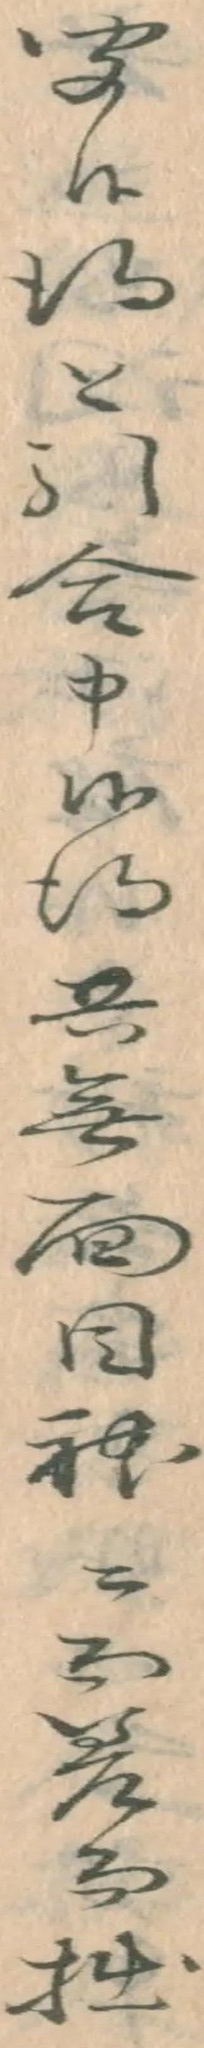聞候得と引合申候得共無面目躰に而差而拙

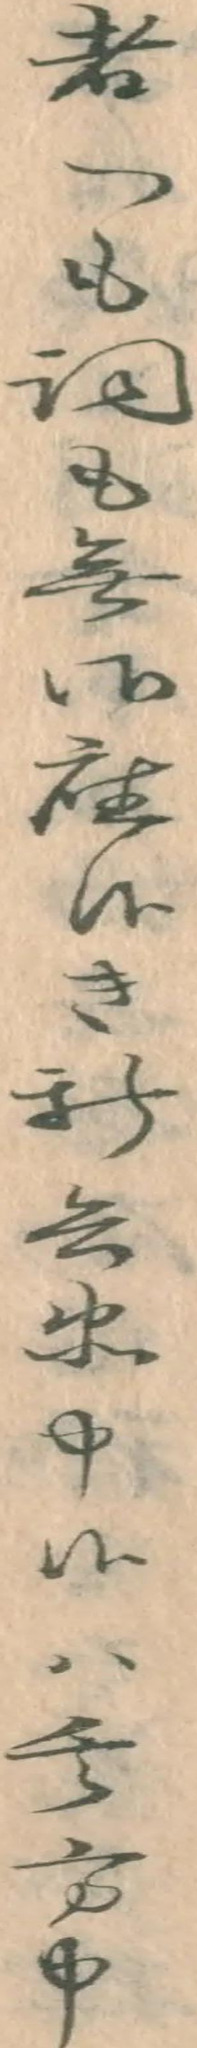者へも詞も無御座候き新兵衛申候は其方申
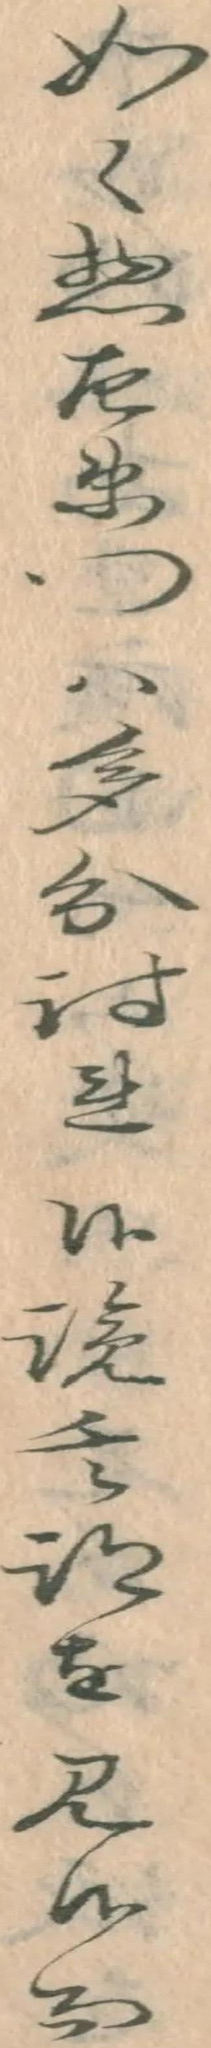如く惣左衛門は多分討連候讒其跡を見候而
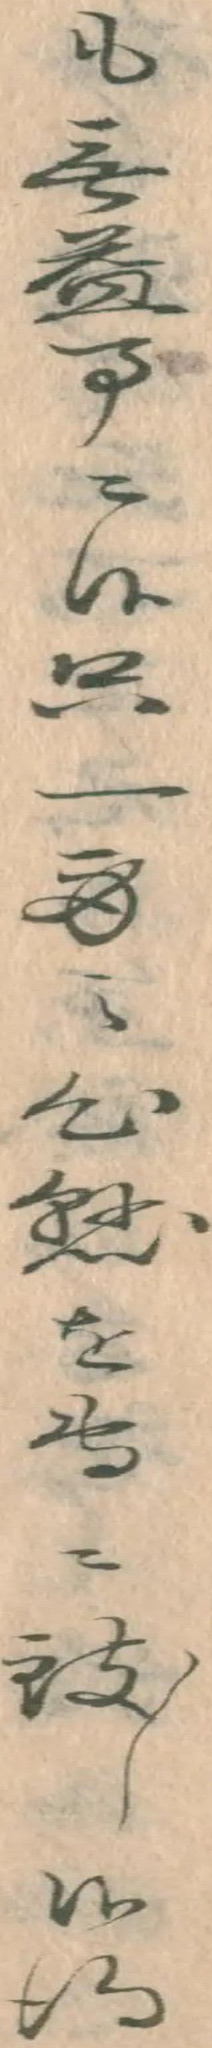も無益事に候只一身之心懸を専に致し候得
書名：切支丹御退治記 49巻. [2]
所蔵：国立国会図書館 National Diet Library, JAPAN
